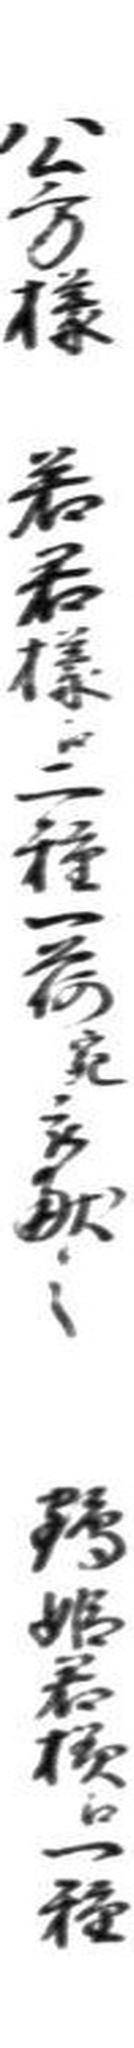公方様若君様江ニ種一荷宛被献之鶴姫君様江一種
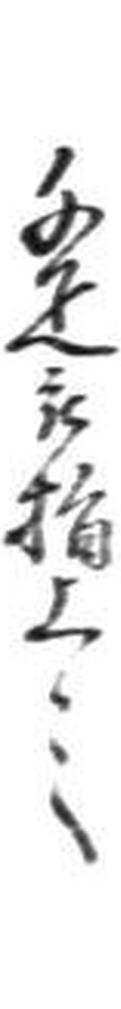千疋被指上之

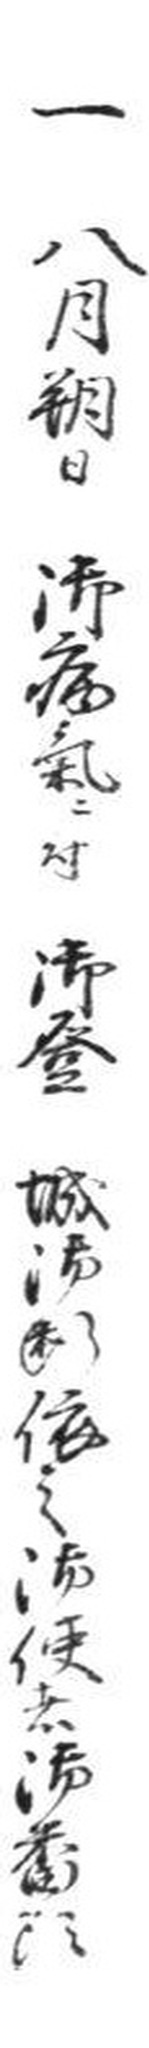一八月朔日御病気ニ付御登城御断依之御使者御番頭
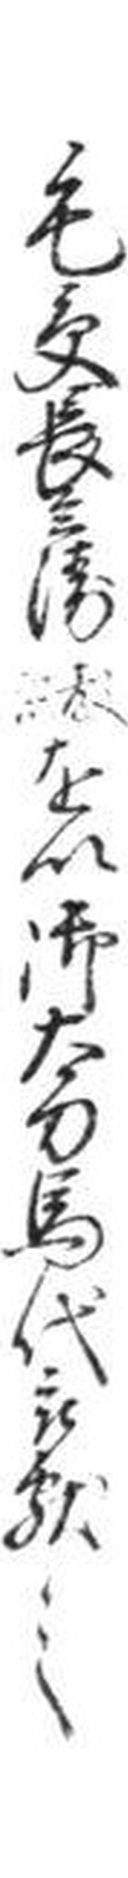毛受長兵衛教洪を以御太刀馬代被献之
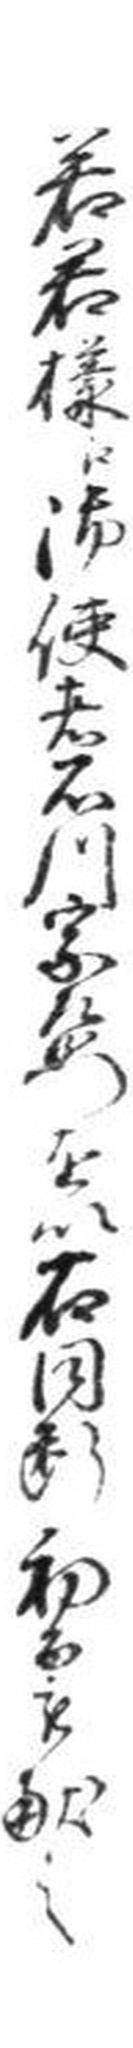若君様江御使者石川宗左衛門を以右同断初而被献之
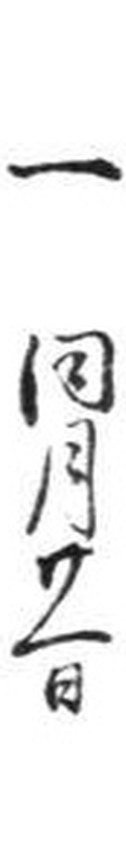一同月廿一日
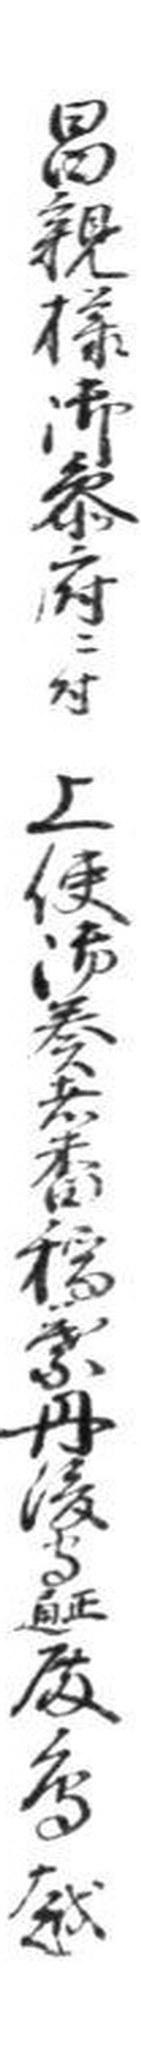昌親様御参府ニ付上使御奏者番稲葉丹後守正通殿鳥越
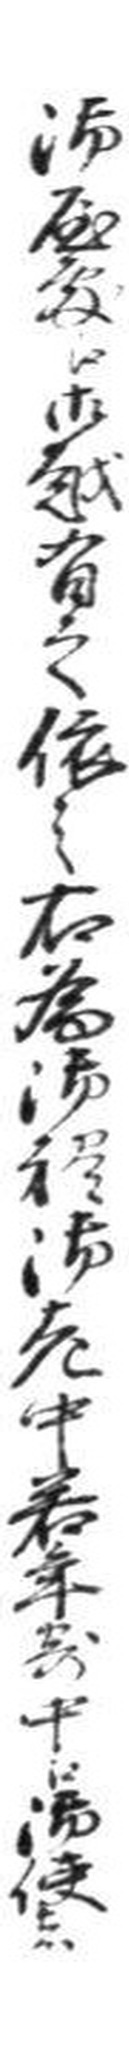御屋敷江御越有之依之右為御礼御老中若年寄中江御使者
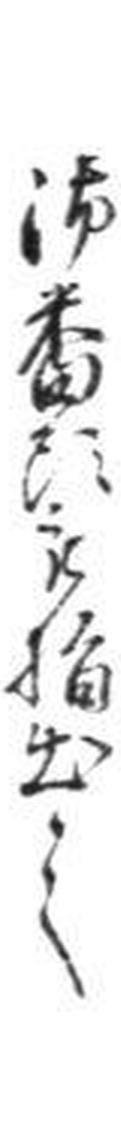御番頭被指出之
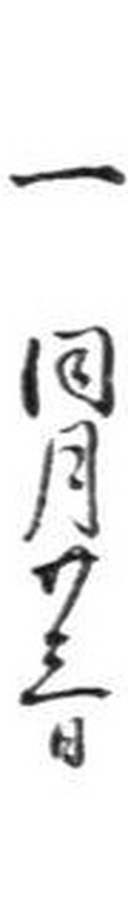一同月廿三日
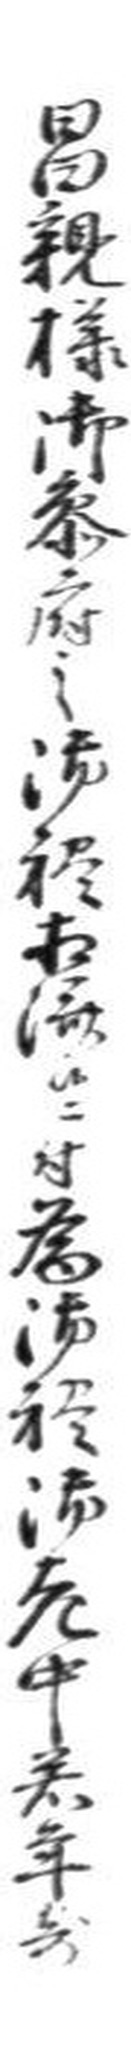昌親様御参府之御礼相済候ニ付為御礼御老中若年寄
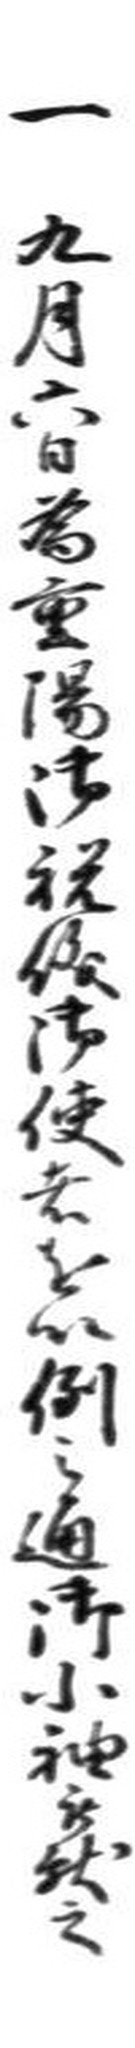一九月六日為重陽御祝儀御使者を以例之通御小袖被献之
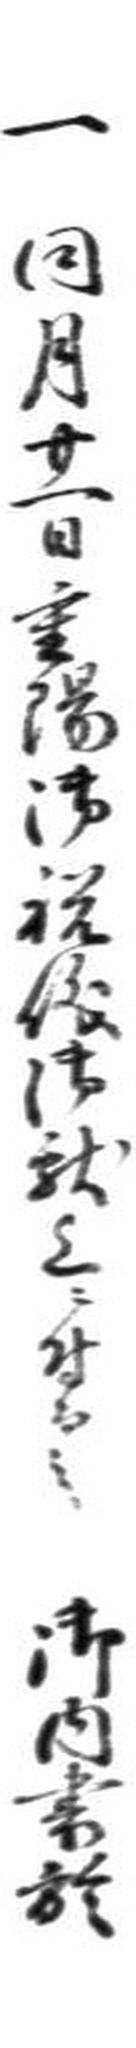一同月廿一日重陽御祝儀御献上ニ付而之御内書於
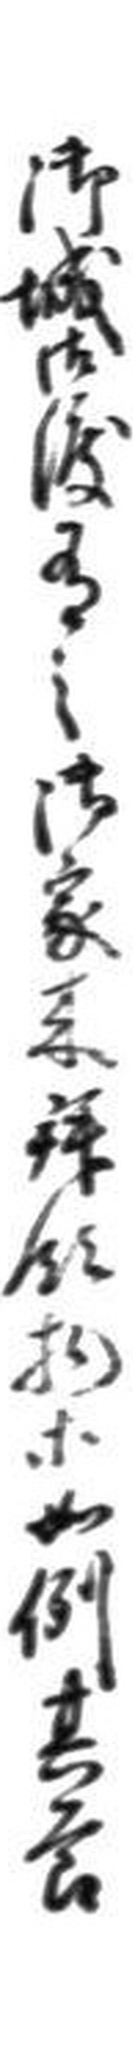御城御渡有之御家来拝領物等如例其節
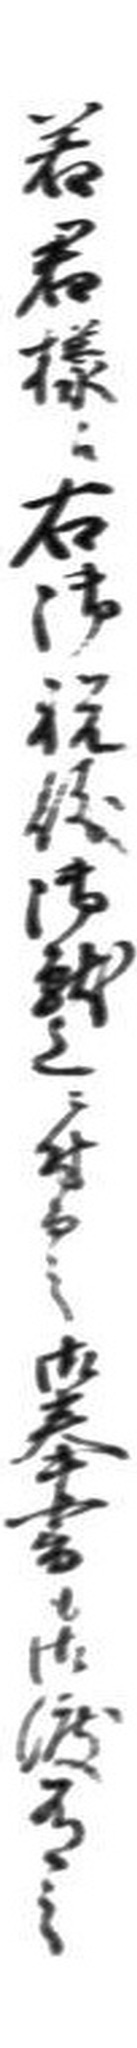若君様ニ右御祝儀御献上ニ付而之御奉書も御渡有之
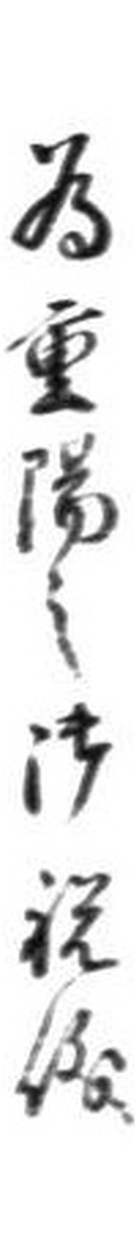為重陽之御祝儀
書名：家譜 十五 綱昌公 従天和元年到元禄十二年
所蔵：福井県文書館 Fukui Prefectural Archives
